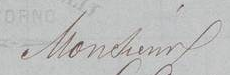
Monsieur
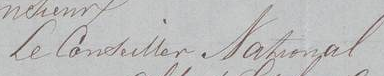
Le Conseiller National
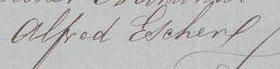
Alfred Escher
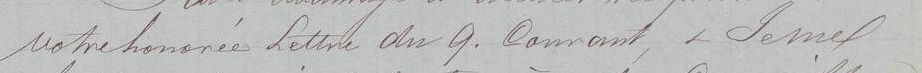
votre honorée Lettre du 9. Courant & Je me
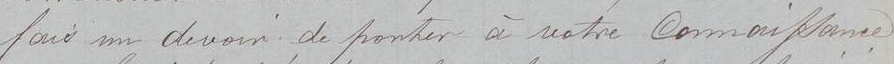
fais un devoir de porter à votre Connaissance
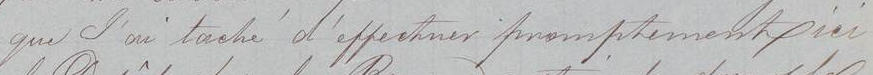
que J'ai taché d'effectuer promptement ici
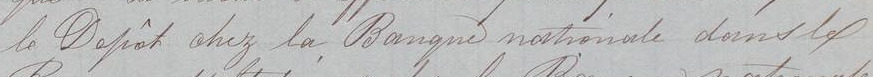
le Depôt chez la Banque nationale dans le
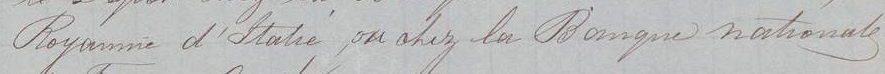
Royaume d'Italie, ou chez la Banque nationale
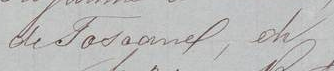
de Toscane, de
